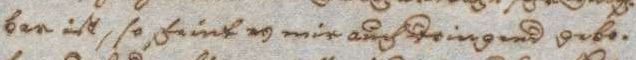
bar ist, so scheint es mir auch dringend gebo-
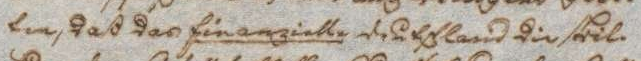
ten, daß das finanzielleDeutschland die Bil-
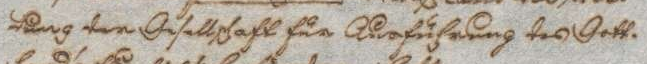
dung der Gesellschaft für Ausführung des Gott-
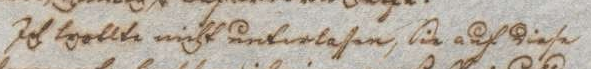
Ich wollte nicht unterlassen, Sie auf diese
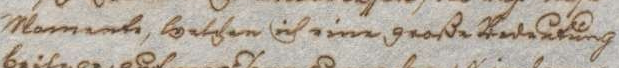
Momente, welchen ich eine große Bedeutung
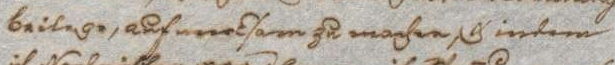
beilege, aufmerksam zu machen, & indem
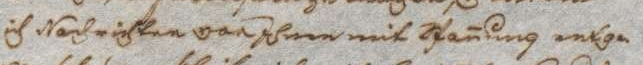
ich Nachrichten von Ihnen mit Spannung entge-
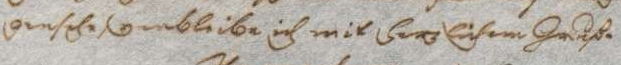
gensehe, verbleibe ich mit herzlichem Gruße
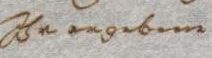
Ihr ergebener
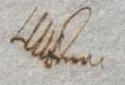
Escher
